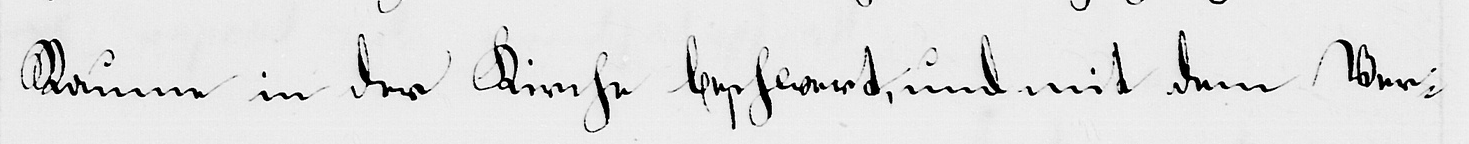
Raume in der Kirche beschwert, und mit dem Ver¬
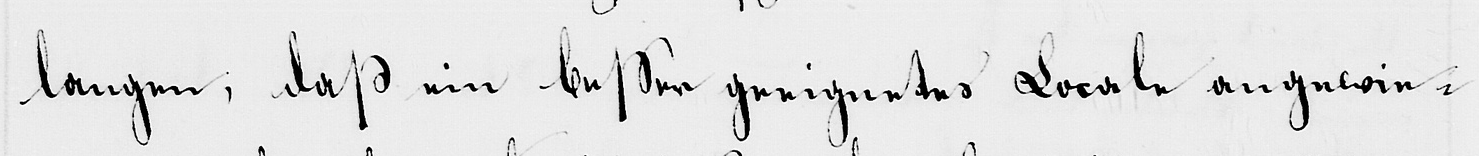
langen, daß ein besser geeignetes Locale angewie¬
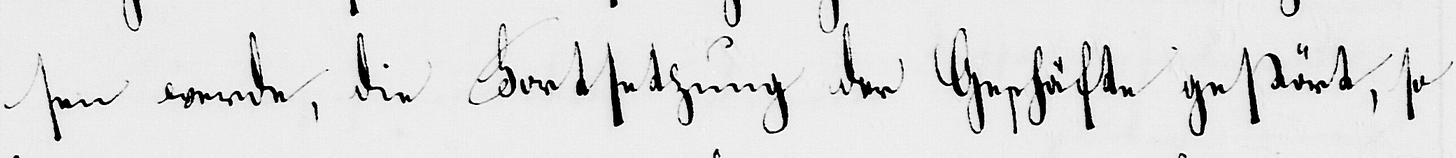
sen werde, die Fortsetzung der Geschäfte gestört, so
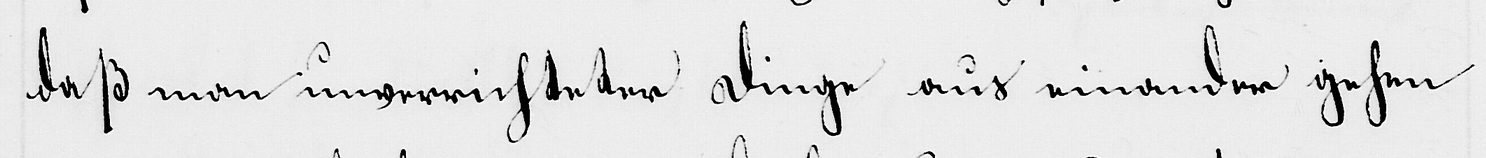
daß man unverrichteter Dinge aus einander gehen
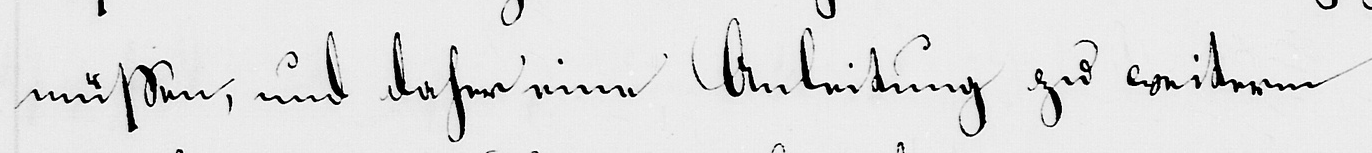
müssen, und daher eine Anleitung zu weiterm
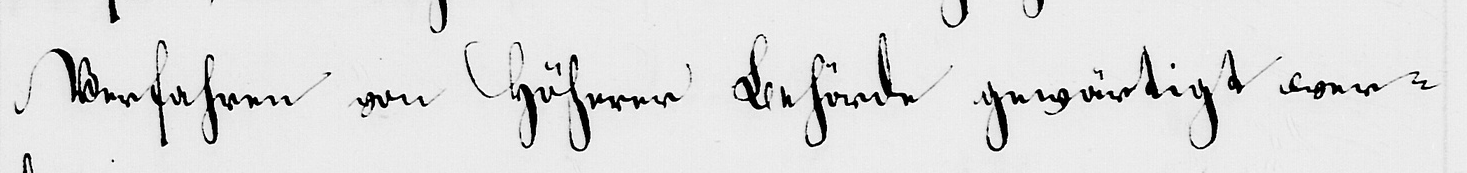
Verfahren von Höherer Behörde gewärtigt wer¬
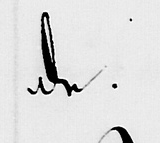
de.
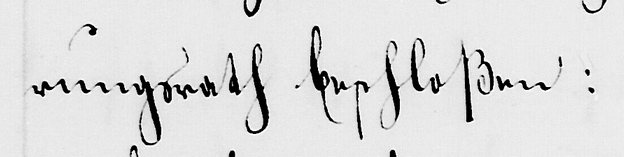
rungsrath beschloßen:
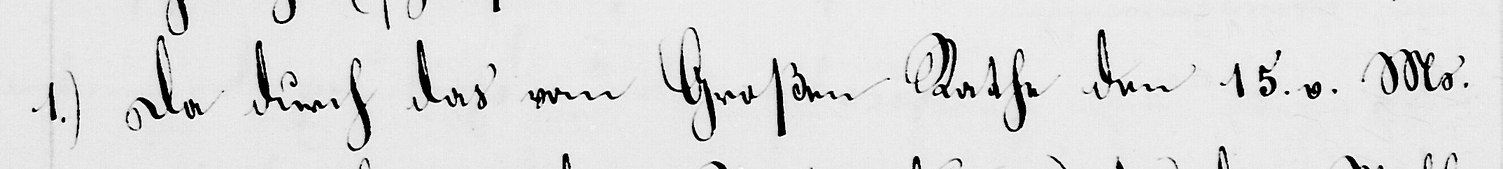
1.) Da durch das vom Großen Rathe den 15. v. Ms.
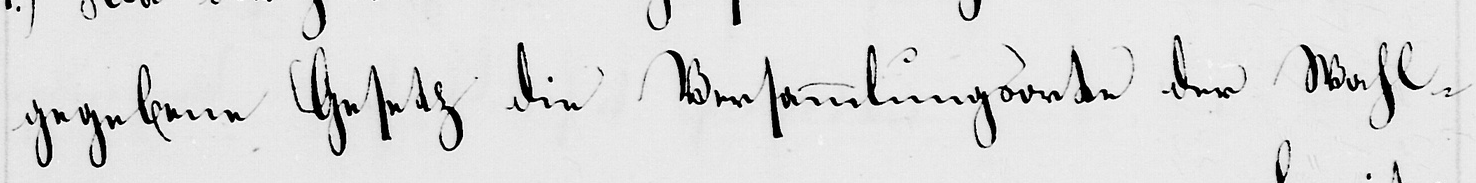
gegebene Gesetz die Versammlungsorte der Wahl-
